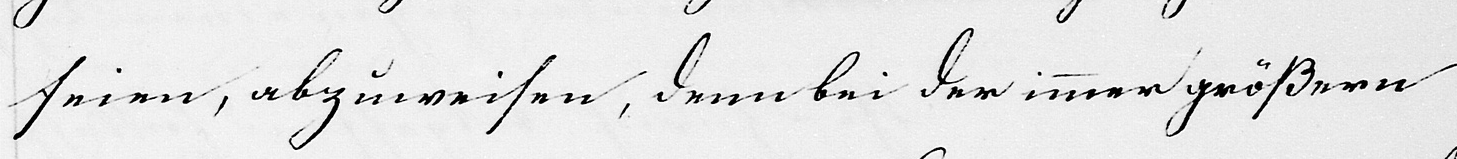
seien, abzuweisen, denn bei der immer größern
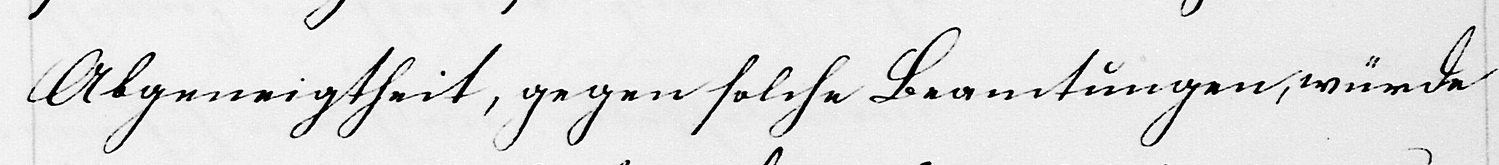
Abgeneigtheit, gegen solche Beamtungen, würde
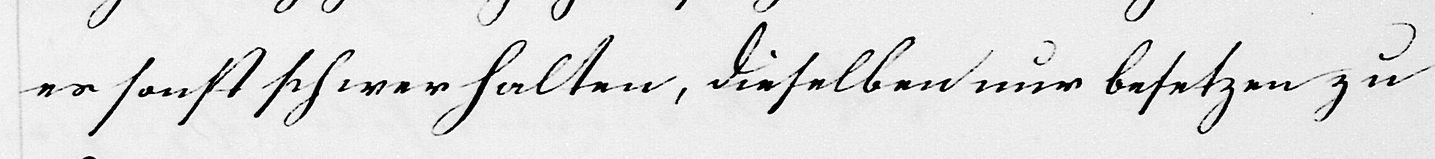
es sonst schwer halten, dieselben nur besetzen zu
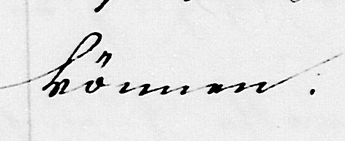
können.
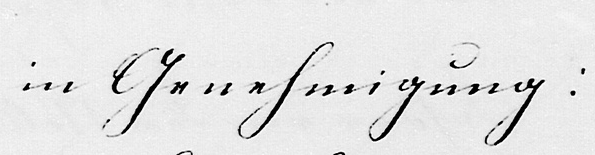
in Genehmigung:
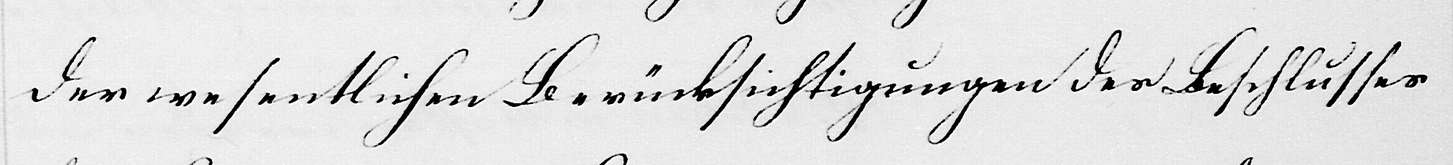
der wesentlichen Berücksichtigungen des Beschlusses
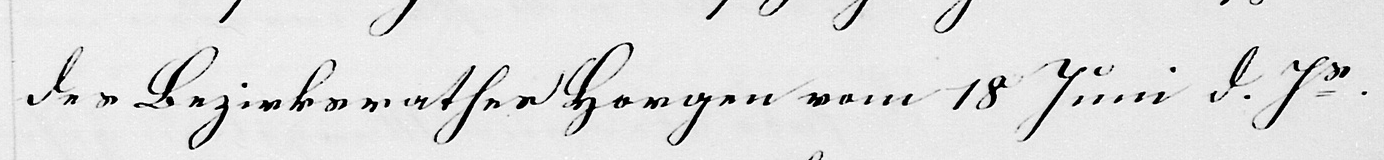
des Bezirksrathes Horgen vom 18 Juni d. Js.
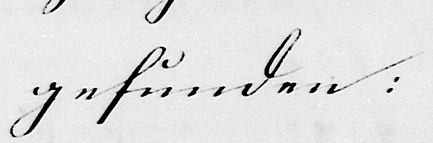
gefunden:
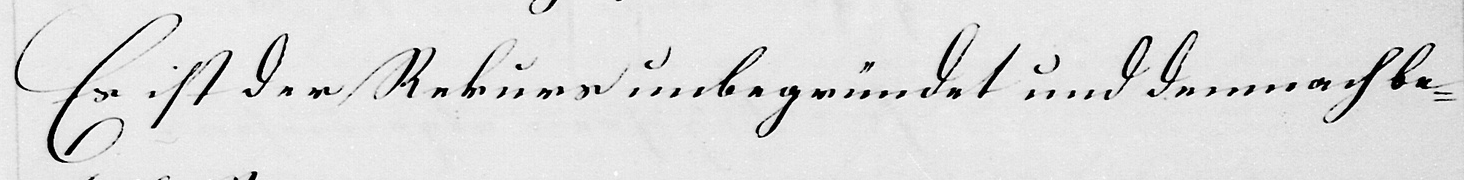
Es ist der Rekurs unbegründet und demnach be¬
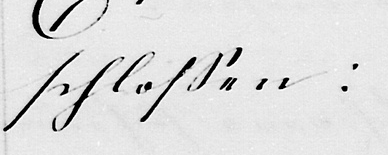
schloßen:
